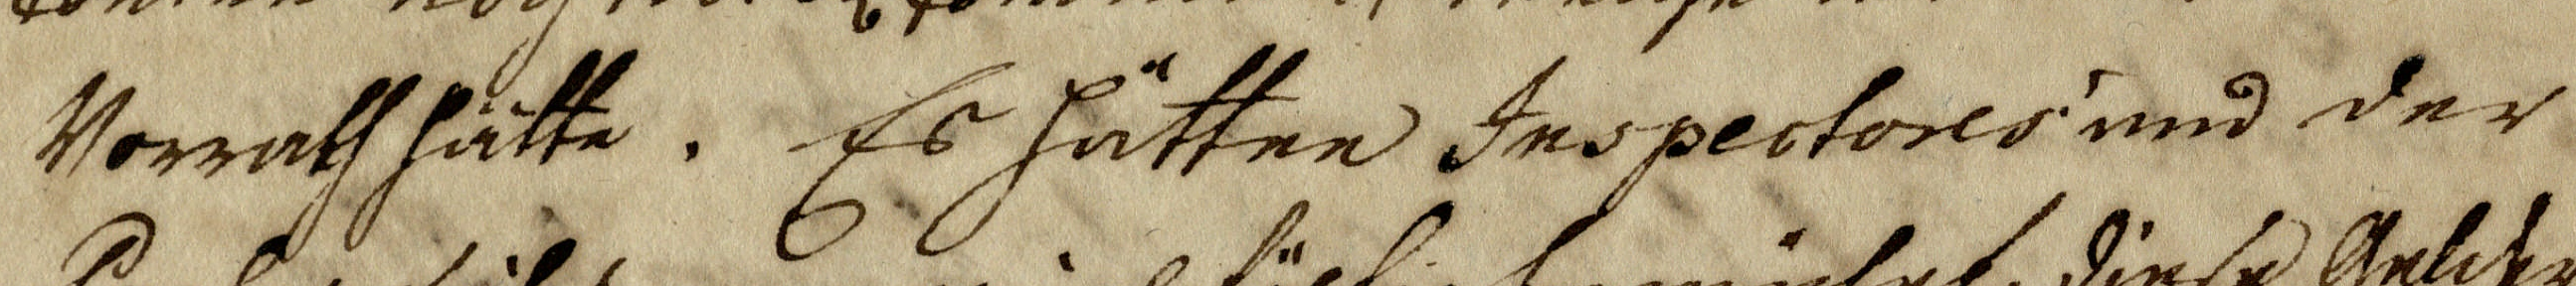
Vorrath hätte. Es hätten Inspectores und der
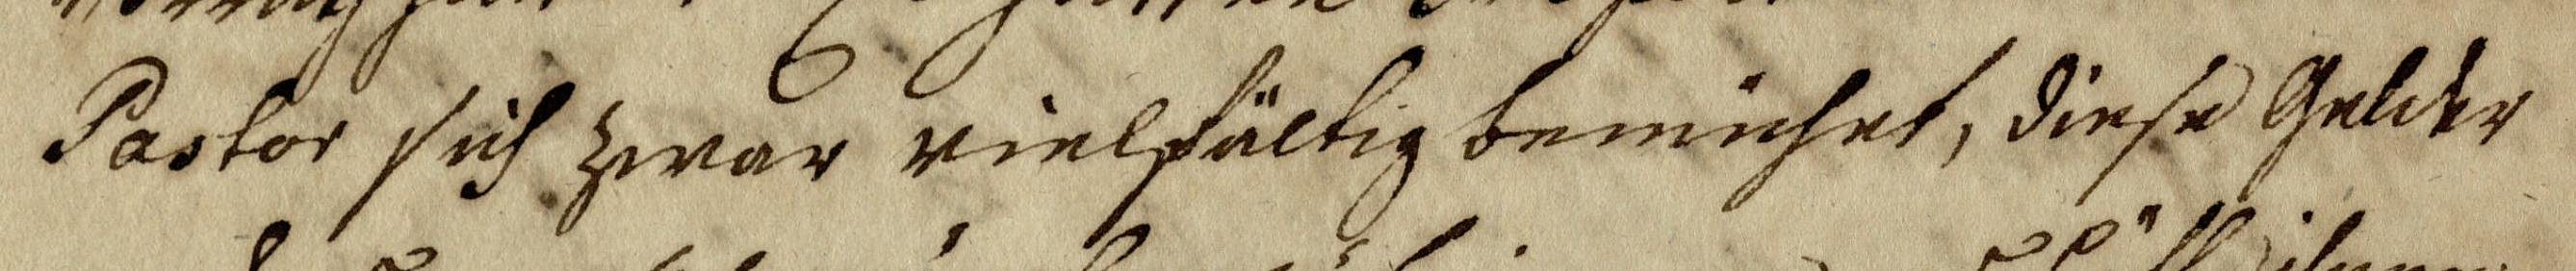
Pastor sich zwar vielfältig bemühet, diese Gelder
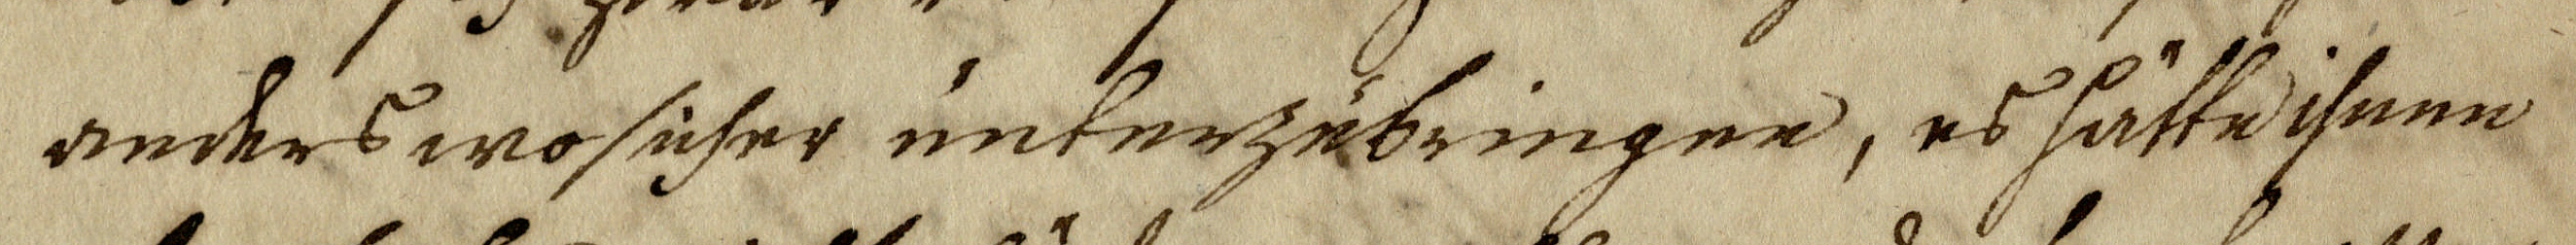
anders wo sicher unterzubringen, es hätte ihnen
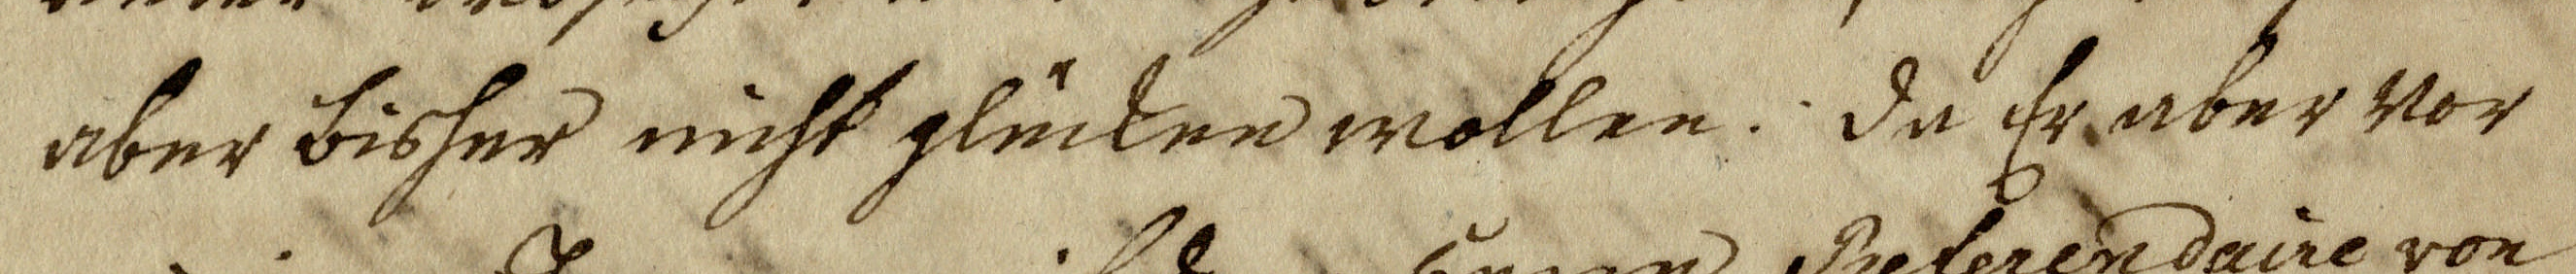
aber bisher nicht glücken wollen. Da Er aber vor
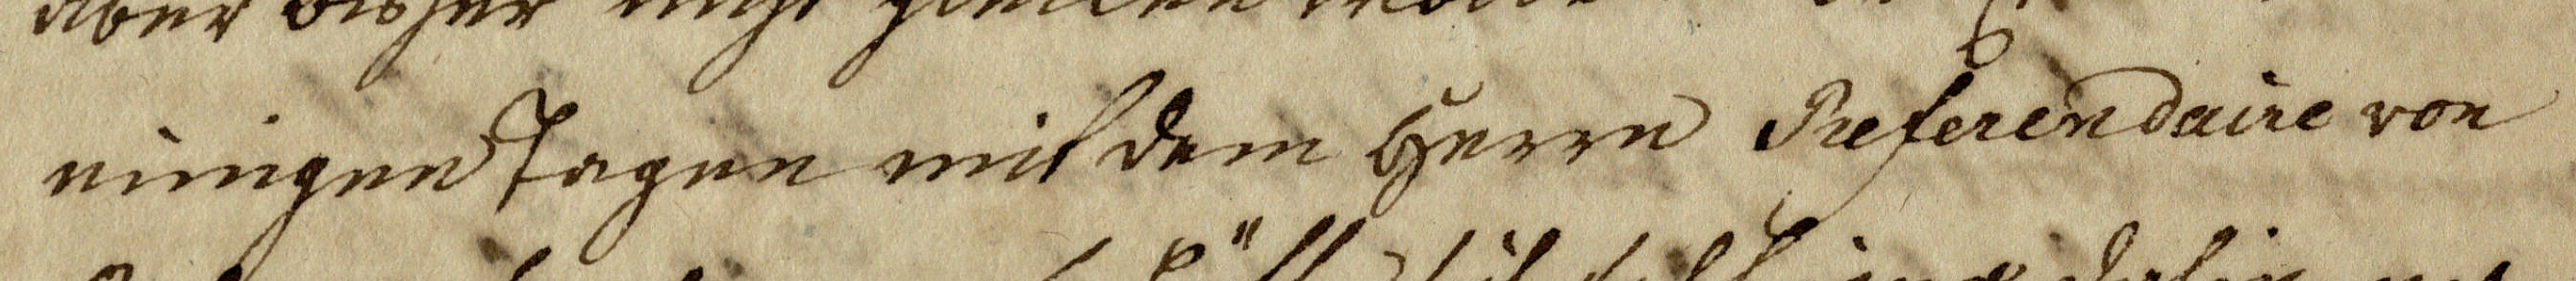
einigen Tagen mit dem Herrn Referendaire von
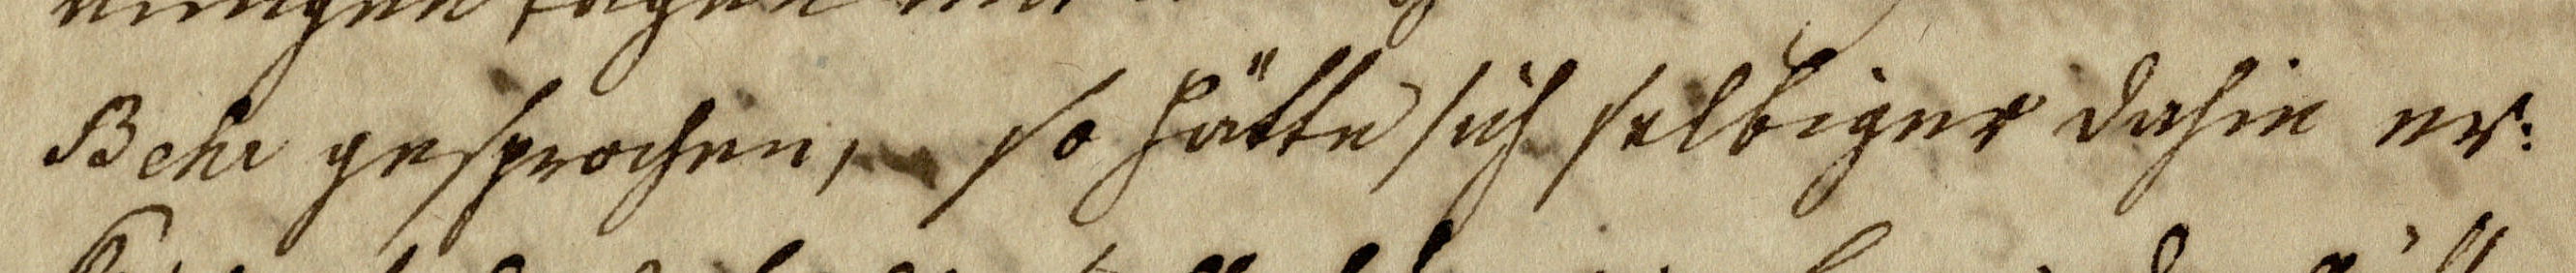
Behr gesprochen, so hätte sich selbiger dahin er¬
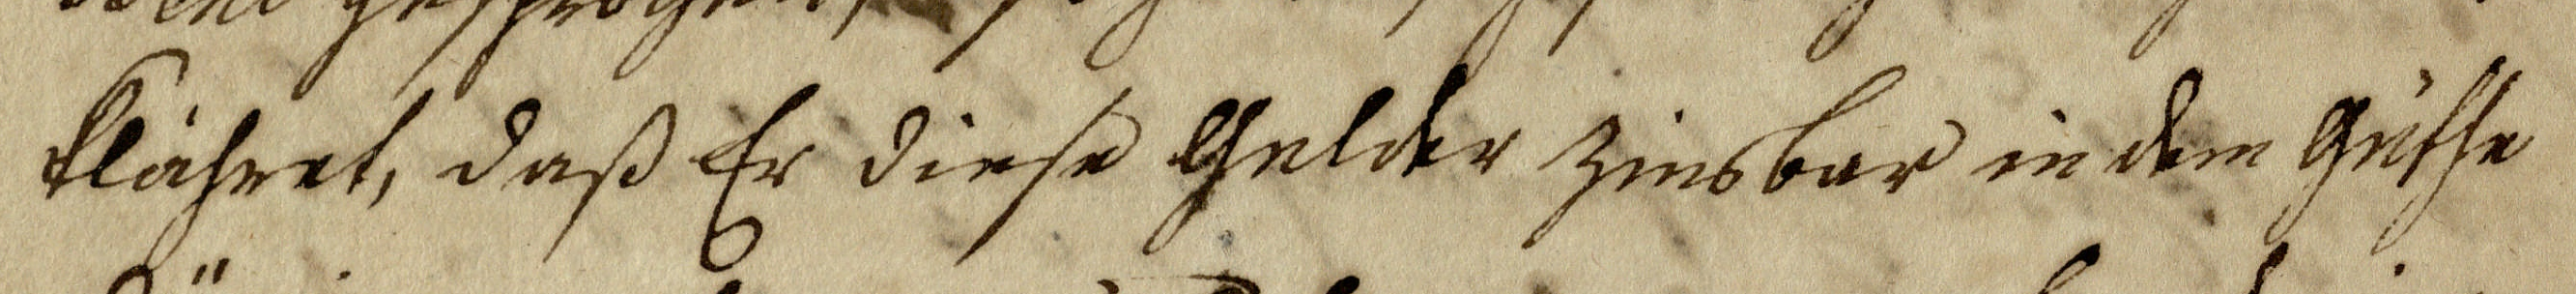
klähret, daß Er diese Gelder zinsbar in dem Guthe
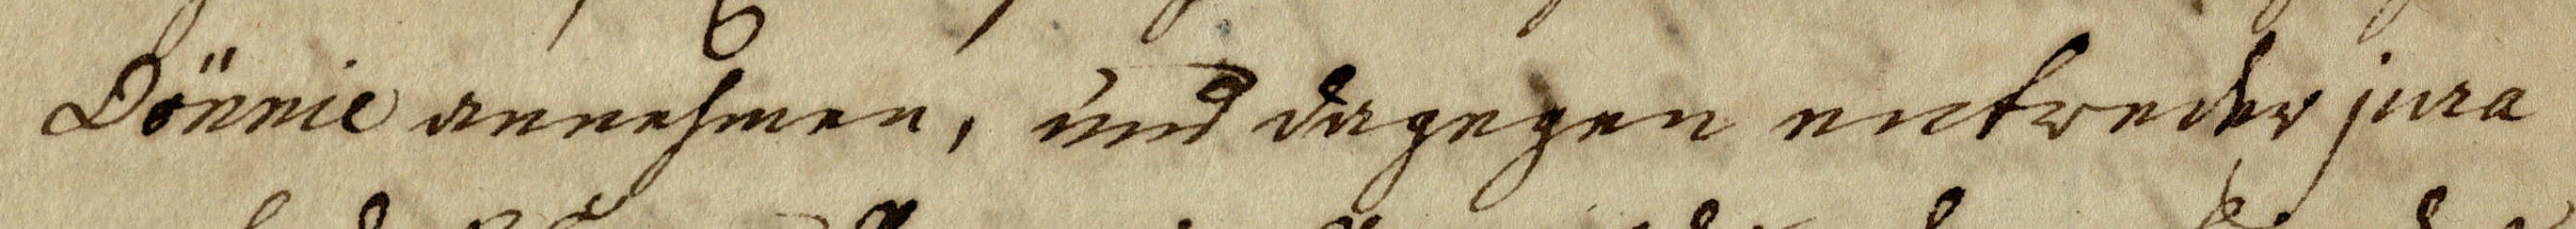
Dönnie annehmen, und dagegen entweder jura
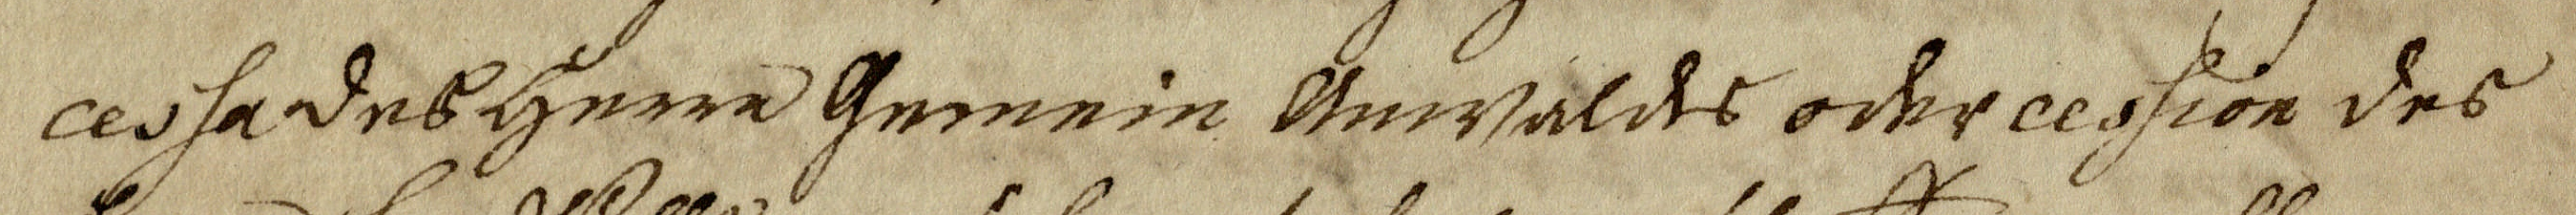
cessa des Herrn Gemein Anwaldes oder cession des
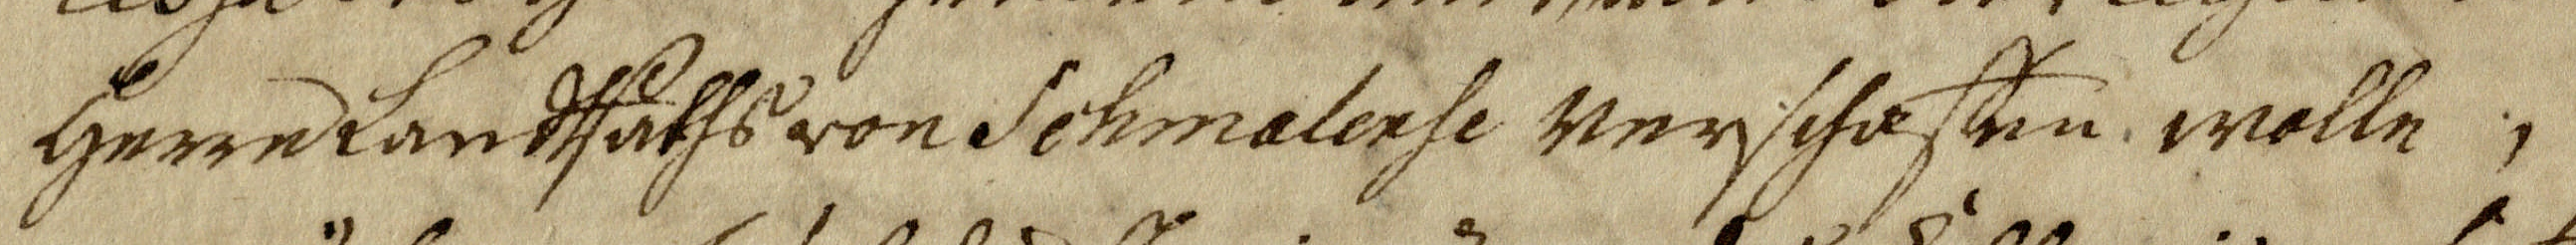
Herrn LandRaths von Schmalense verschaffen wolle,
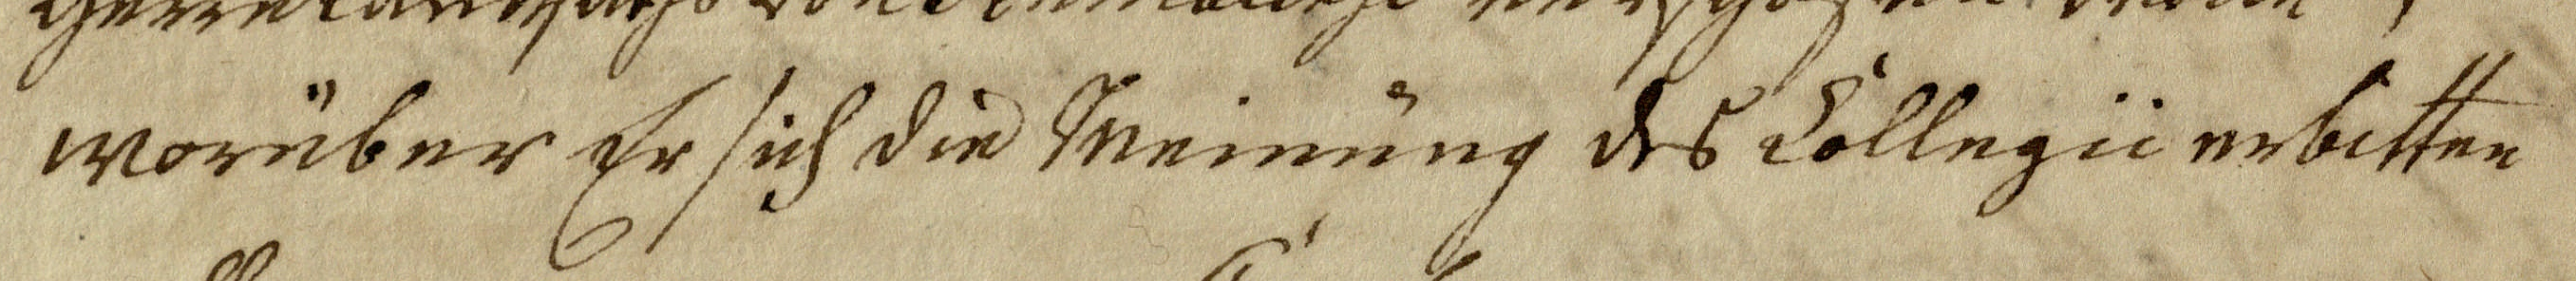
worüber Er sich die Meinung des Collegii erbitten
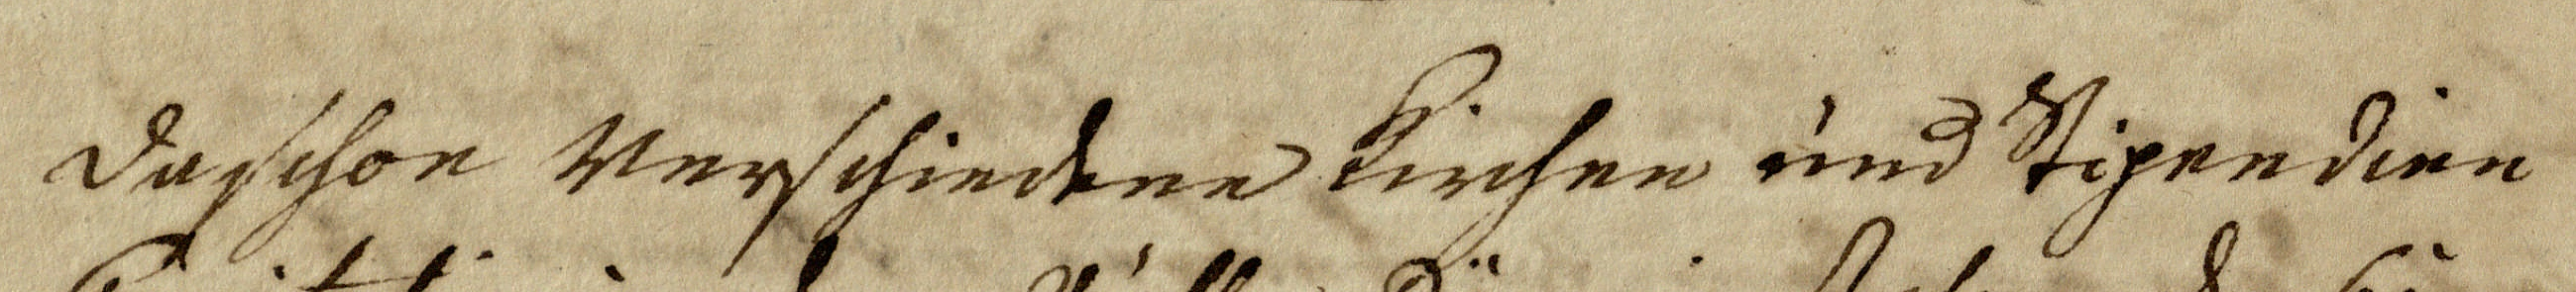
Daschon verschiedene Kirchen und Stipendien
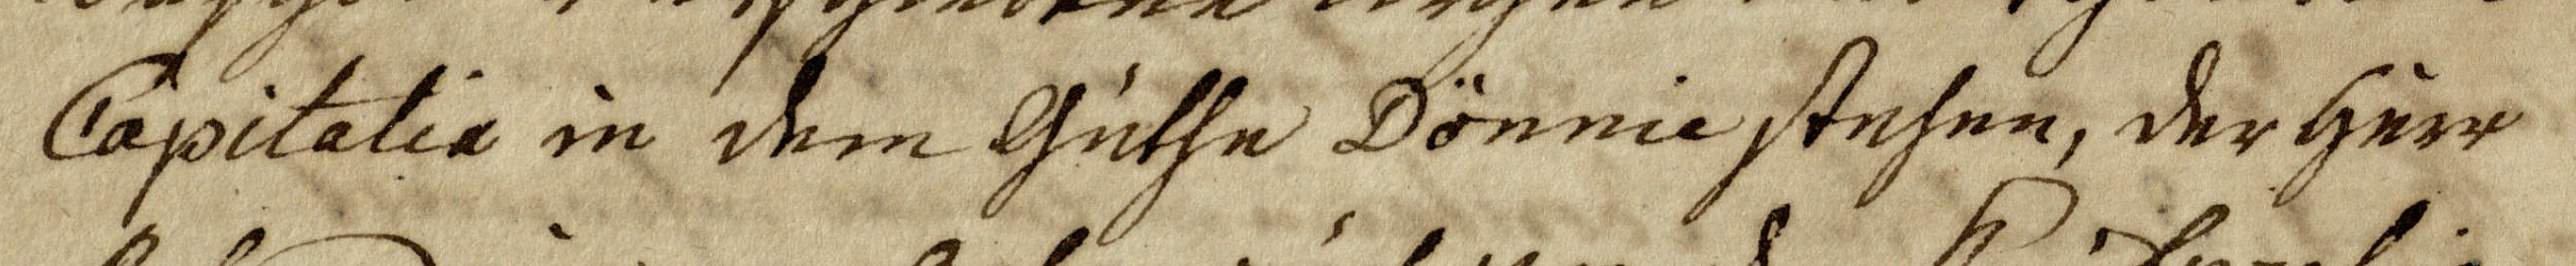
Capitalia in dem Guthe Dönnie stehen, der Herr
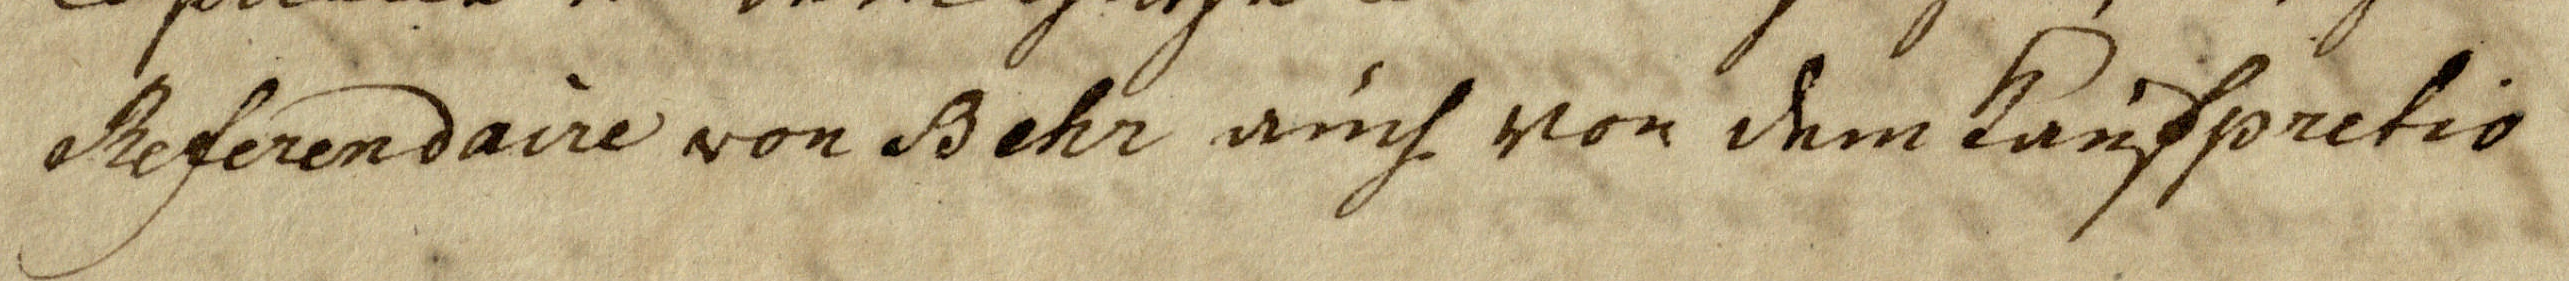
Referendaire von Behr auch von dem Kaufpretio
